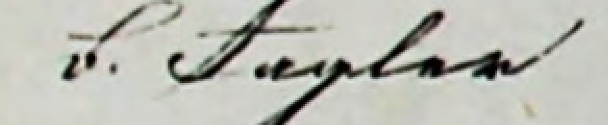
v. Fagler
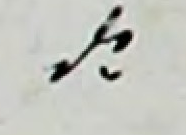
do
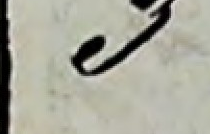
3
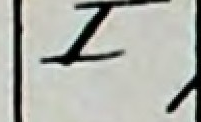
I
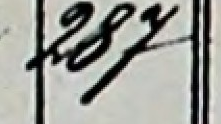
287
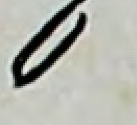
6
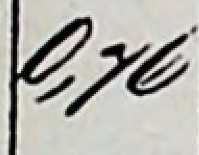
0,76
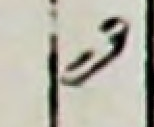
3
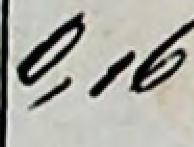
0,16
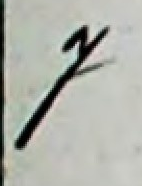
7
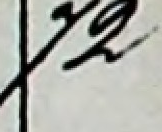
72
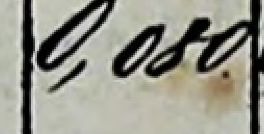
0,080
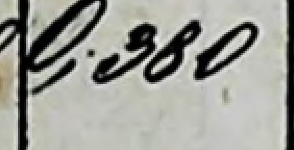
0,380
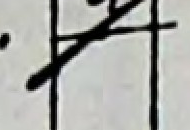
7
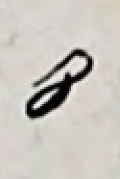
8
